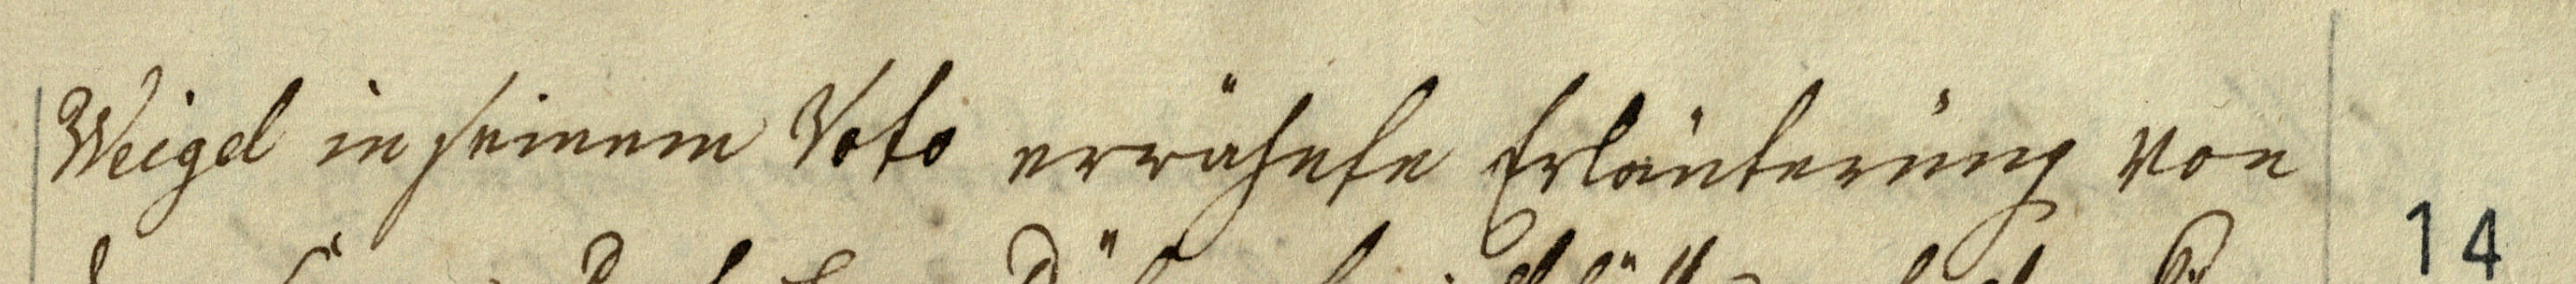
Weigel in seinem Voto erwähnte Erläuterung von
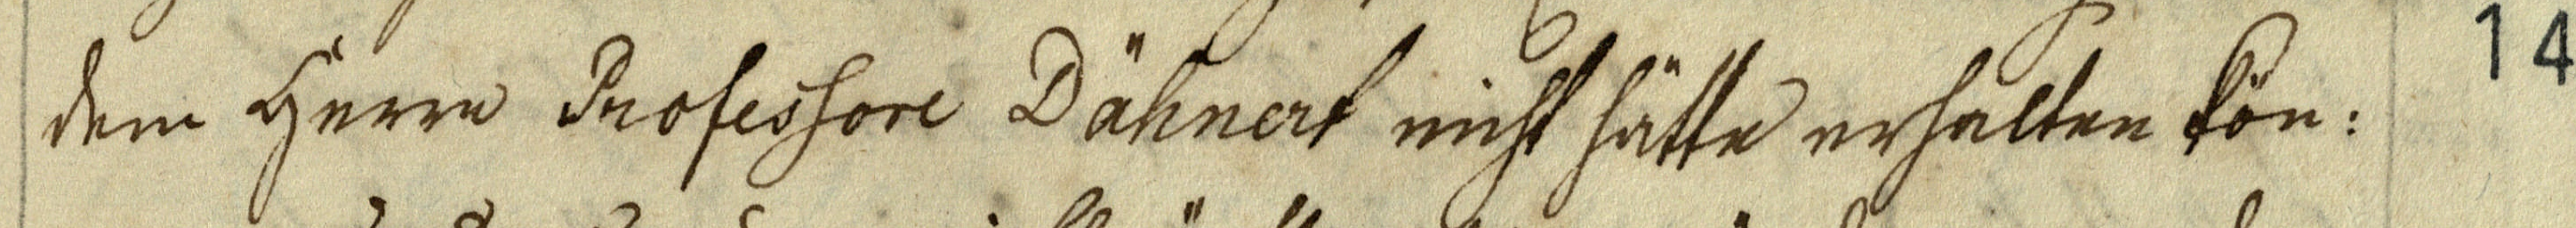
dem Herrn Professore Dähnert nicht hätte erhalten kön¬
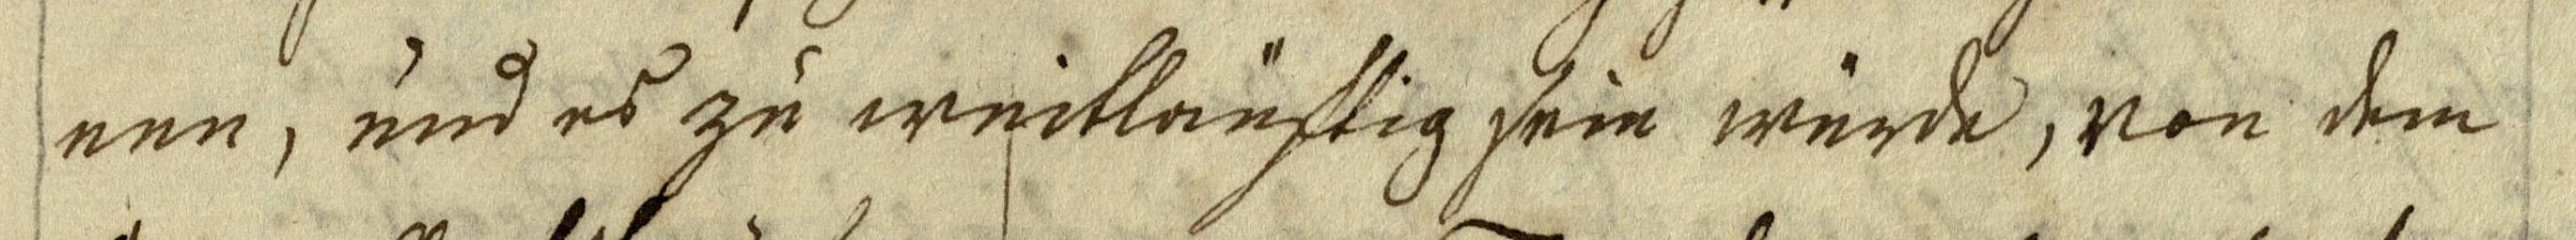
nen, und es zu weitläuftig sein würde, von dem
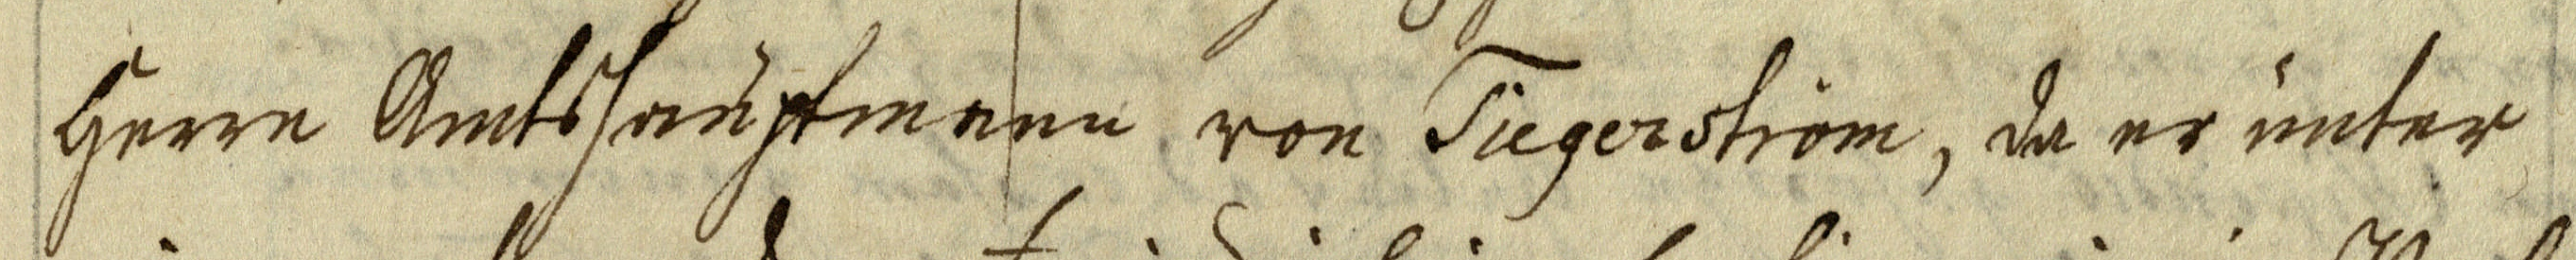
Herrn Amtshauptmann von Tiegerström, da er unter
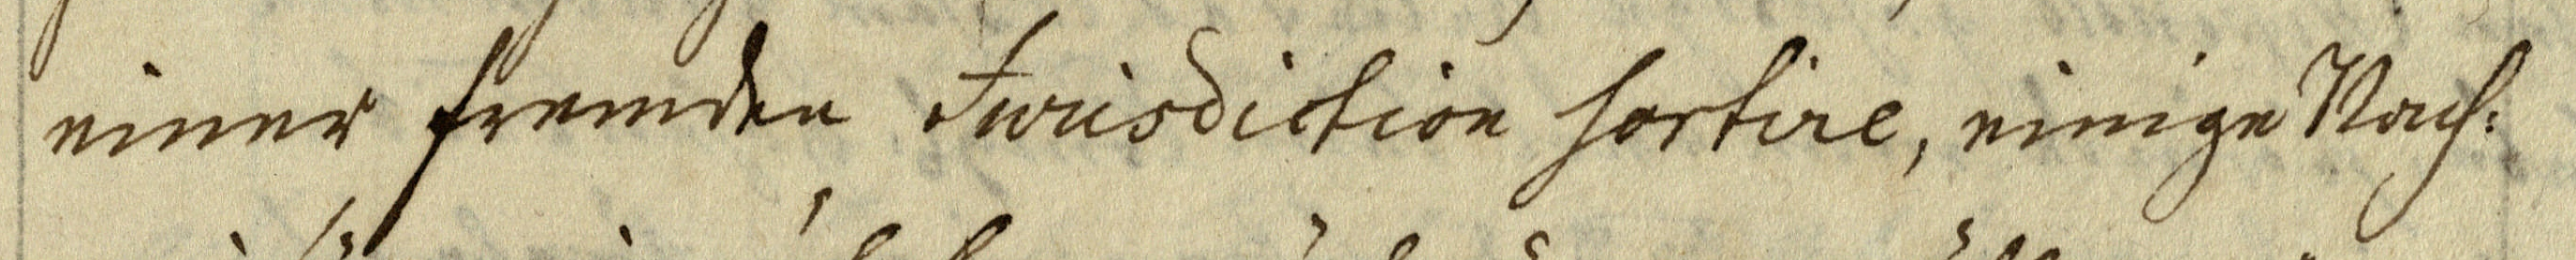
einer fremden Jurisdiction sortire, einige Nach¬
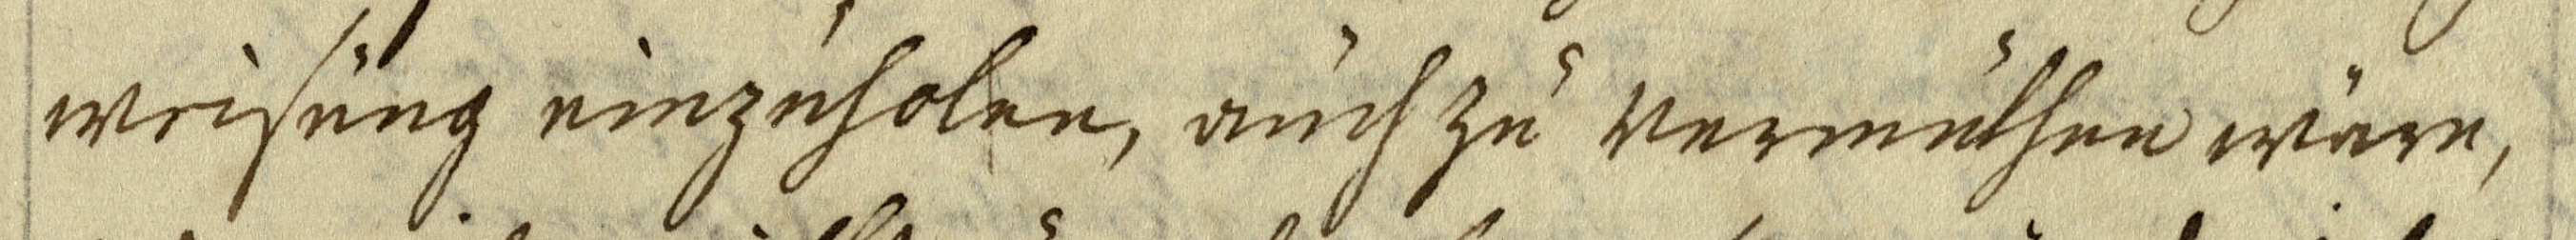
weisung einzuholen, auch zu vermuthen wäre,
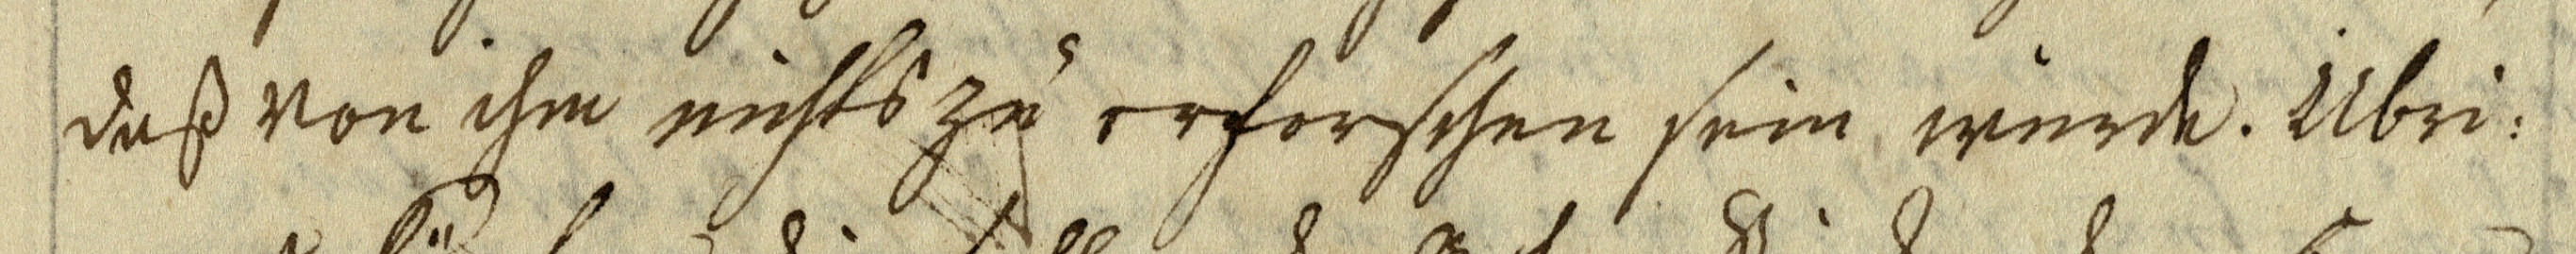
daß von ihm nichts zu erforschen sein würde. Übri¬
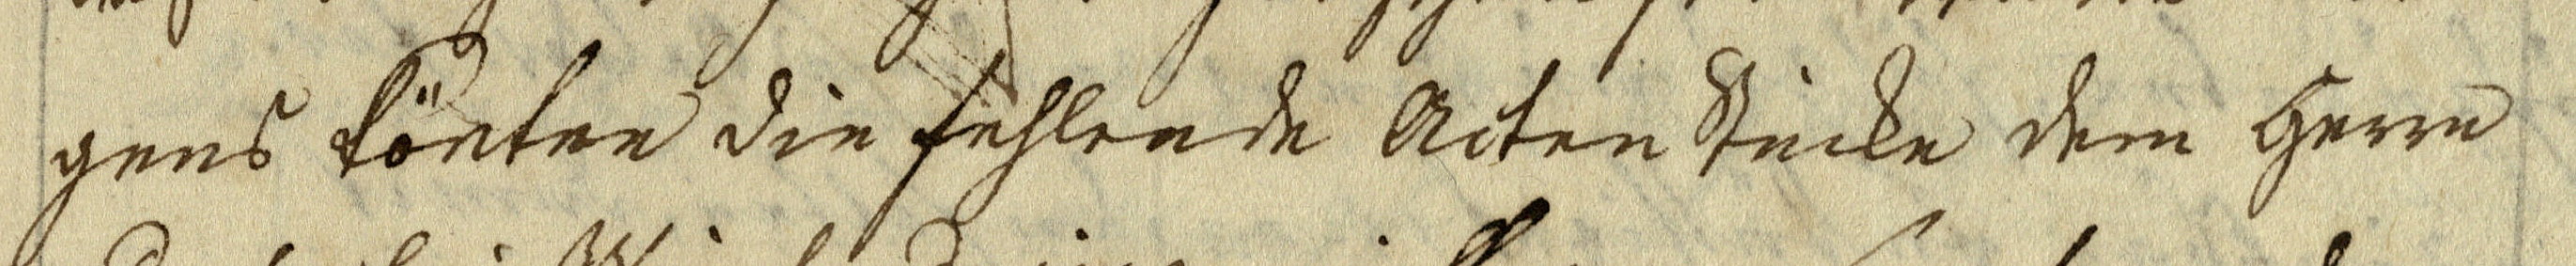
gens könten die fehlende Acten Stücke dem Herrn
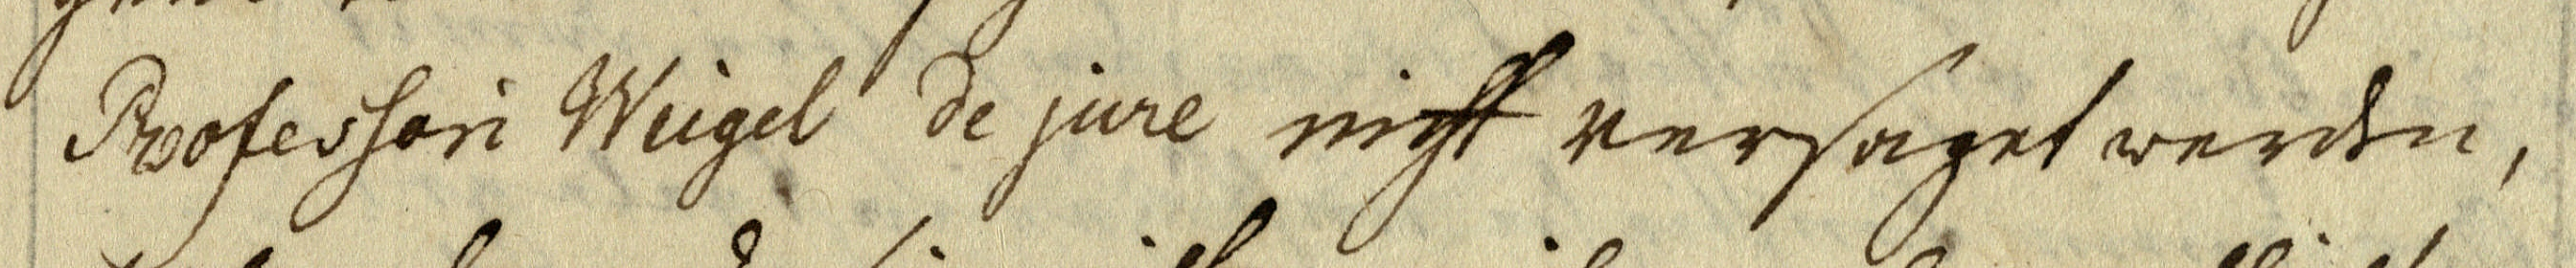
Professori Weigel de jure nicht versaget werden,
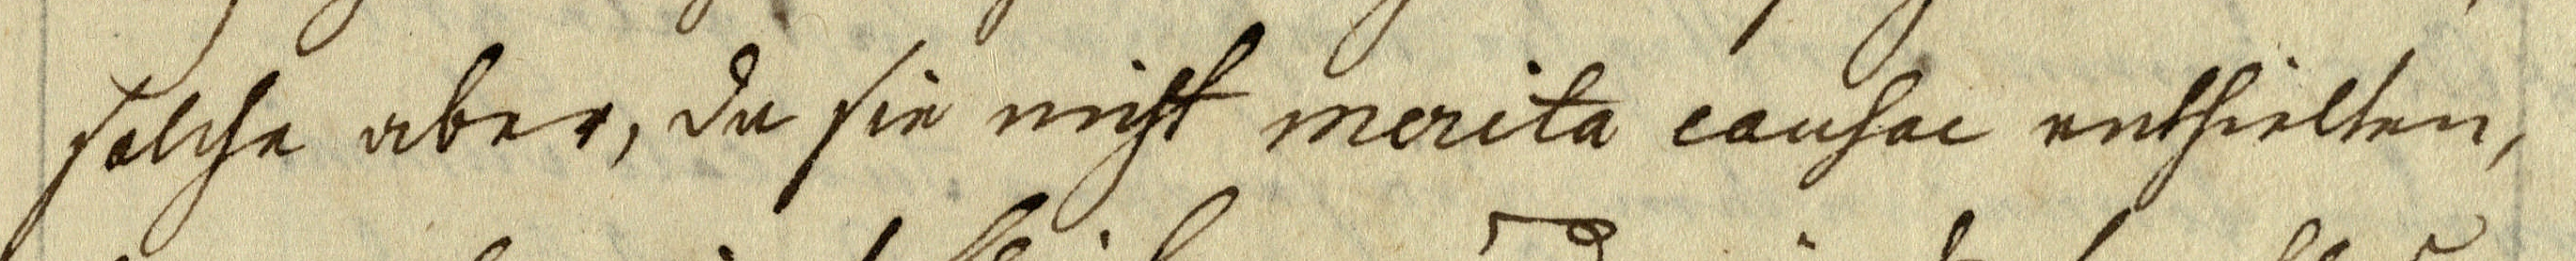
solche aber, da sie nicht merita causae enthielten,
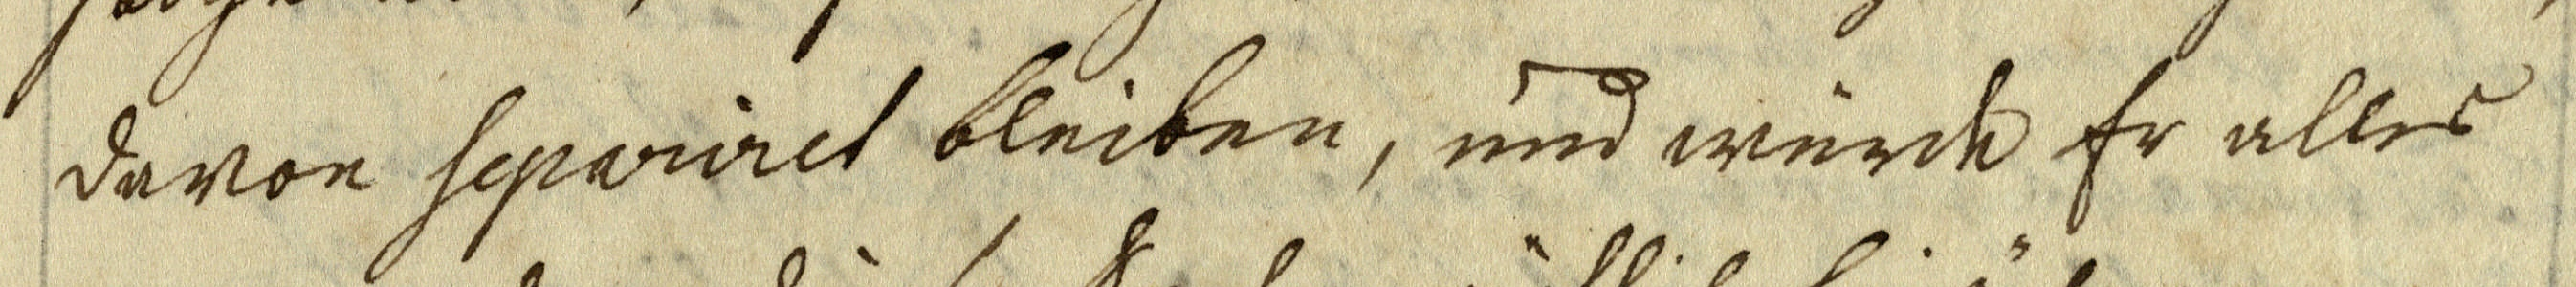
davon separiret bleiben, und würde Er alles
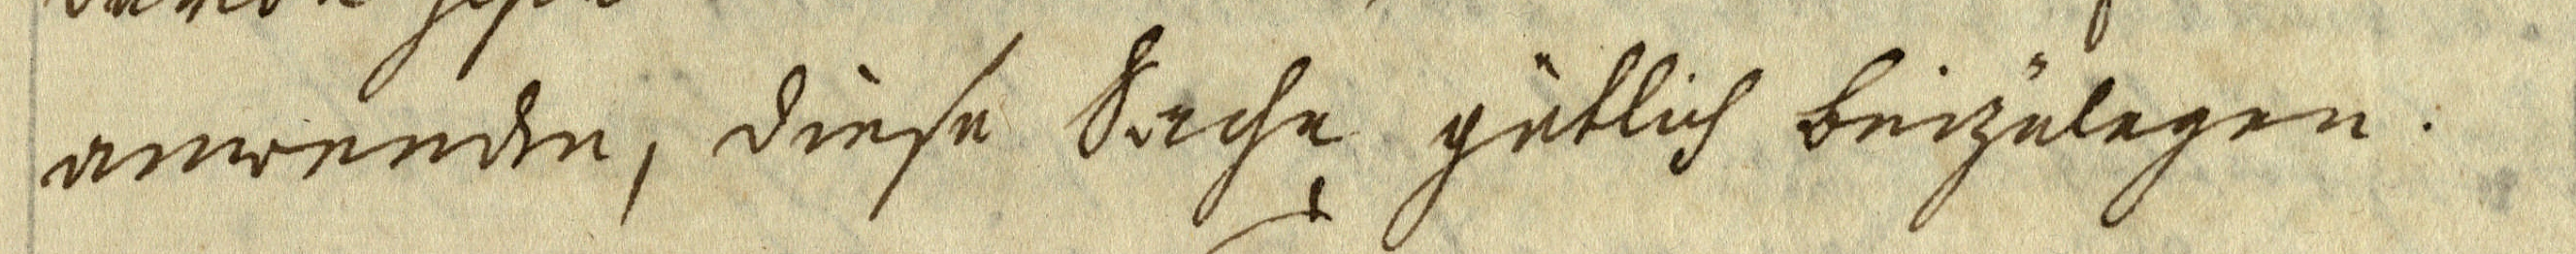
anwenden, diese Sache gütlich beizulegen.
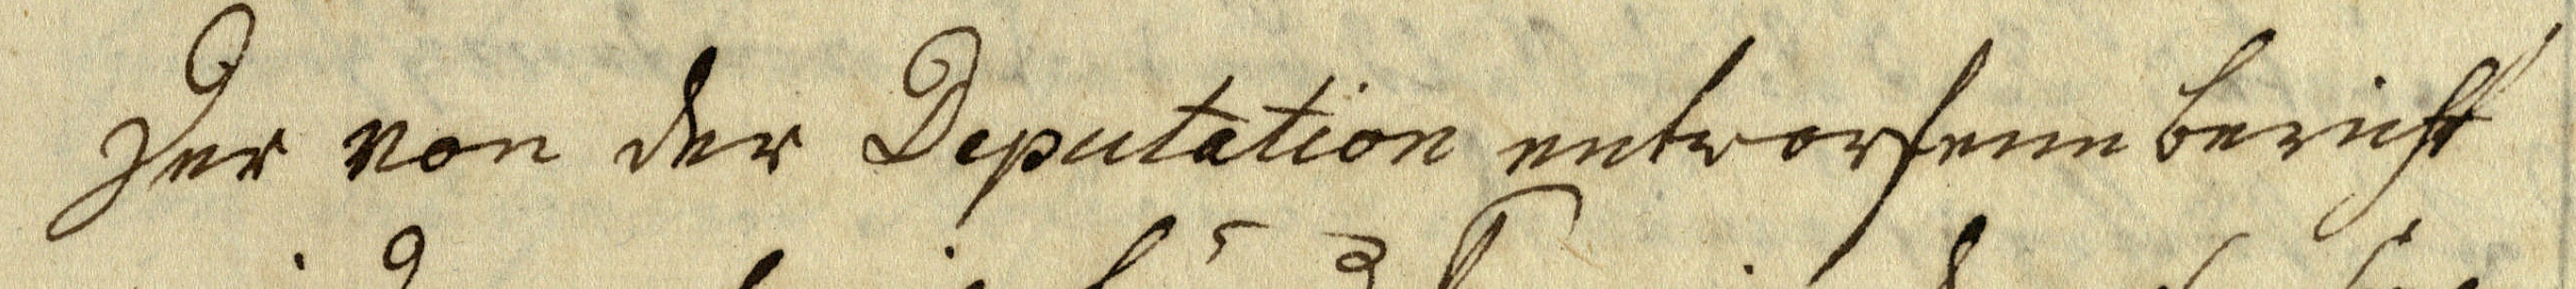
Der von der Deputation entworfenen Bericht
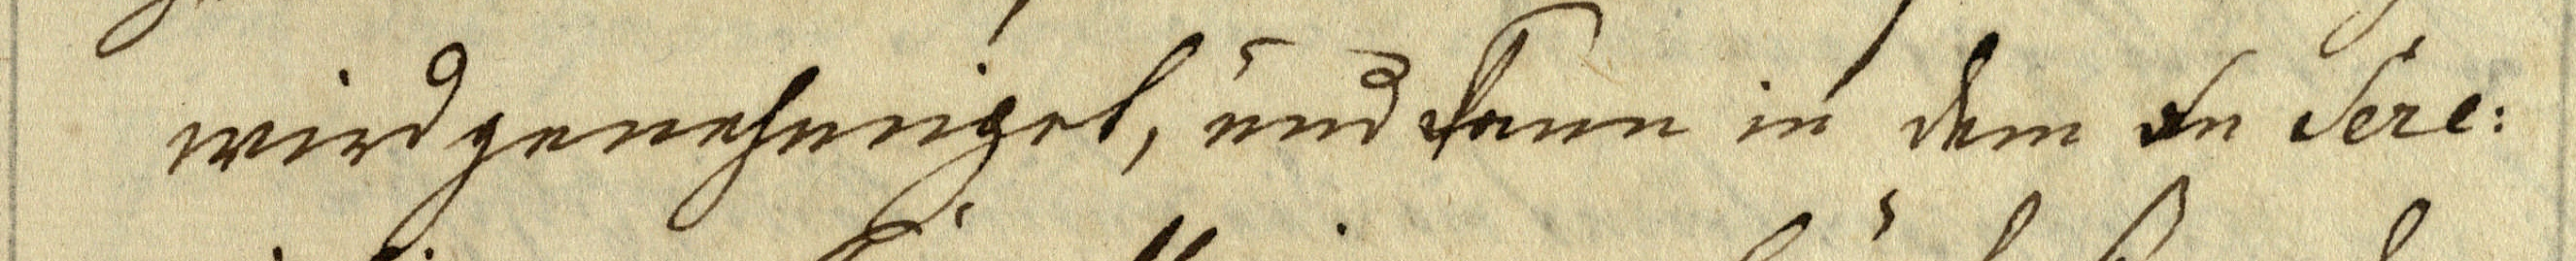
wird genehmiget, und kann in dem an sere¬
